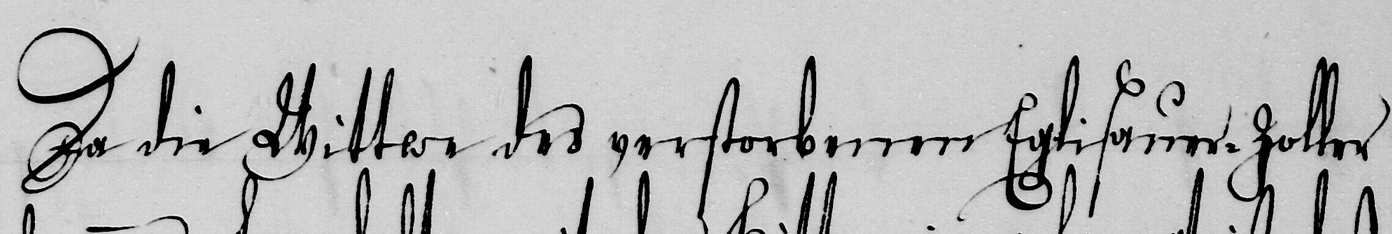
Da die Wittwe des verstorbenen Eglisauer-Zol¬
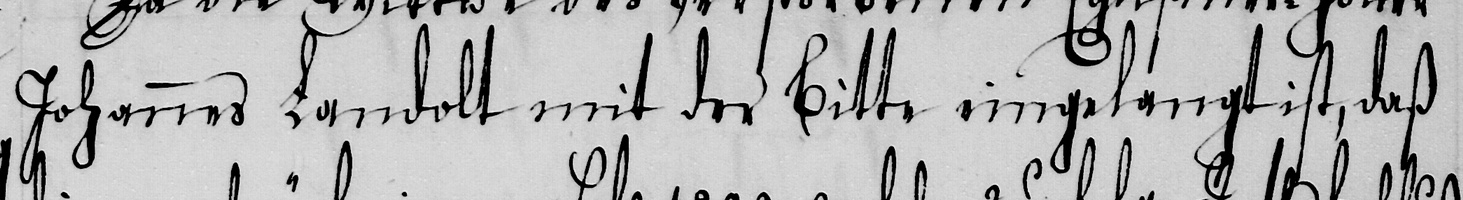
Johannes Landolt mit der Bitte eingelangt ist, daß
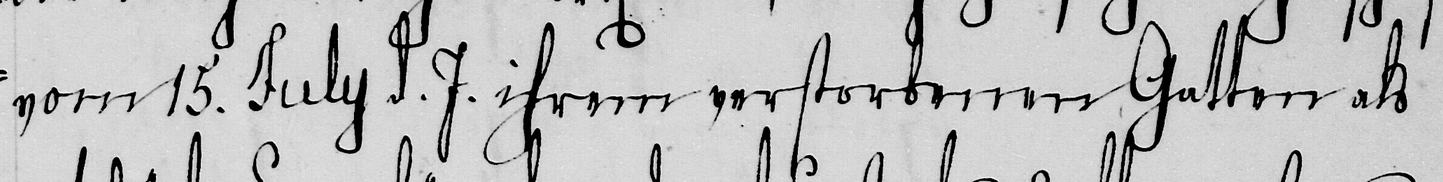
vom 15. July d. J. ihrem verstorbenen Gatten als
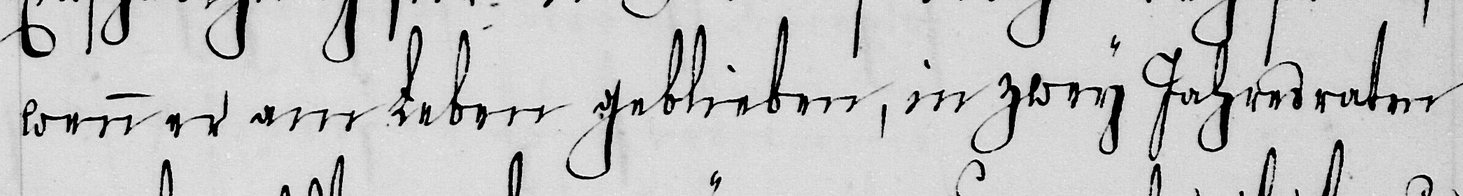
wenn er am Leben geblieben, in zwey Jahresraten
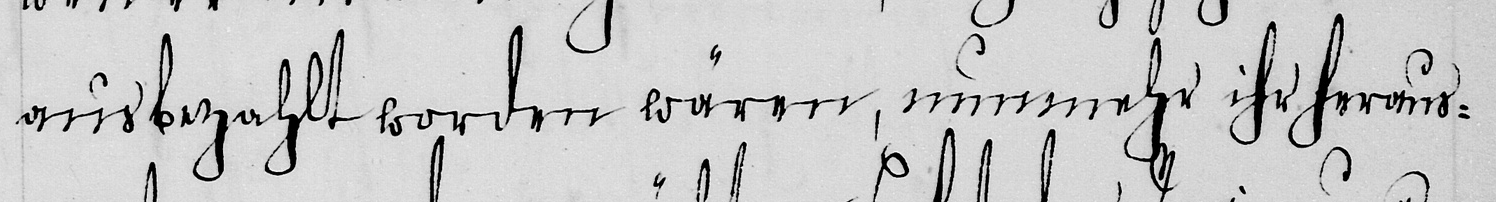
ausbezahlt worden wären, nunmehr ihr heraus¬
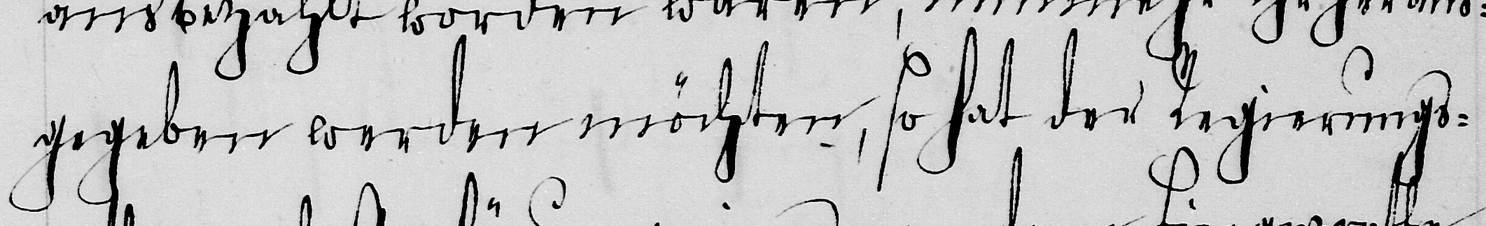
gegeben werden möchten, so hat der Regierungs¬
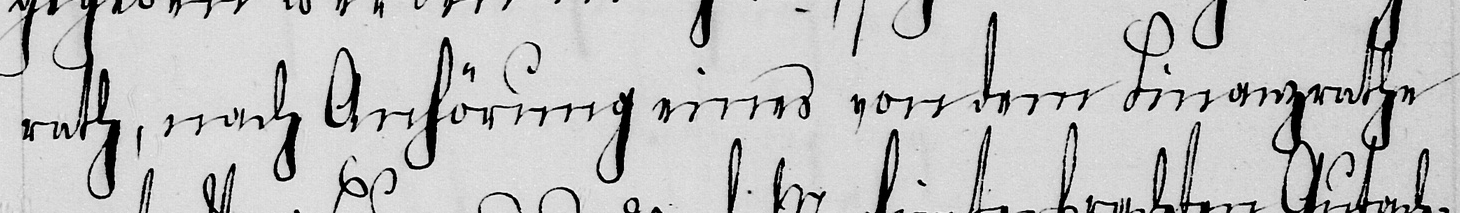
rath, nach Anhörung eines von dem Finanzrathe
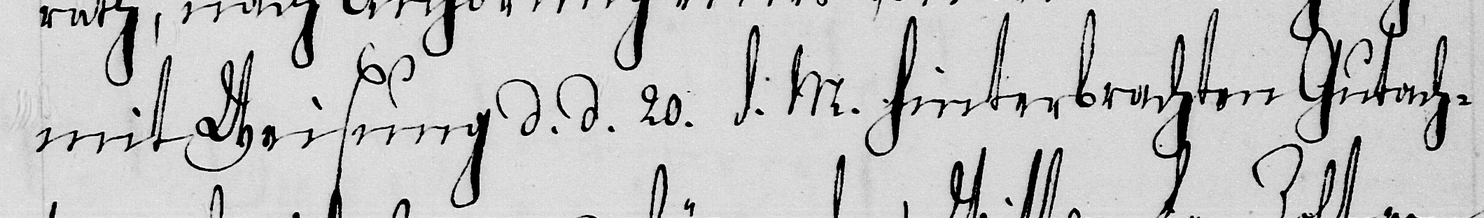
mit Weisung d. d. 20. d. M. hinterbrachten Gutach¬
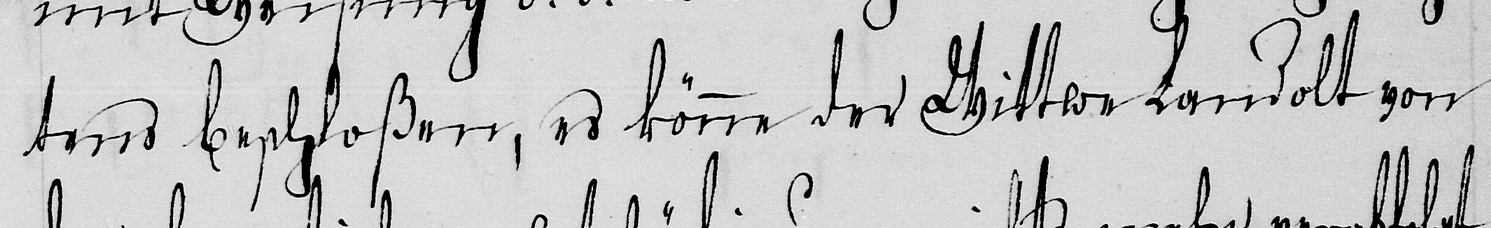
tens beschloßen, es könne der Wittwe Landolt von
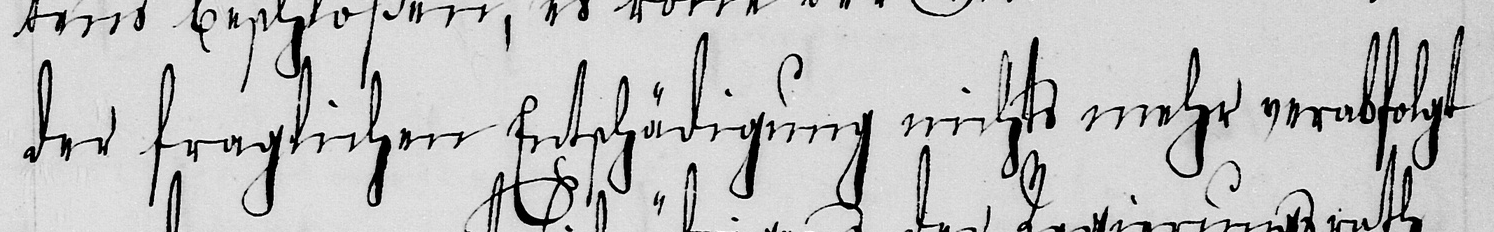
der fraglichen Entschädigung nichts mehr verabfolgt
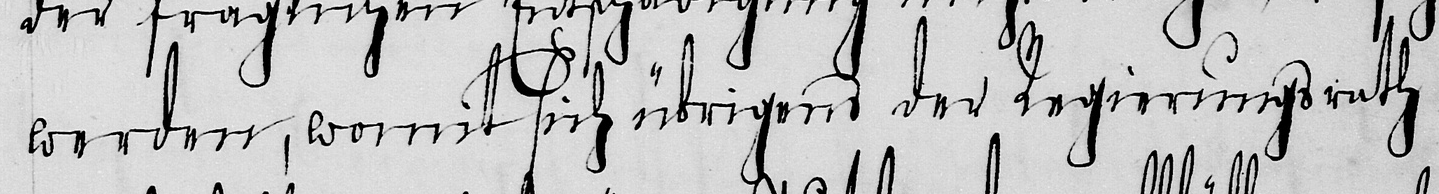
werden, womit sich übrigens der Regierungsrath
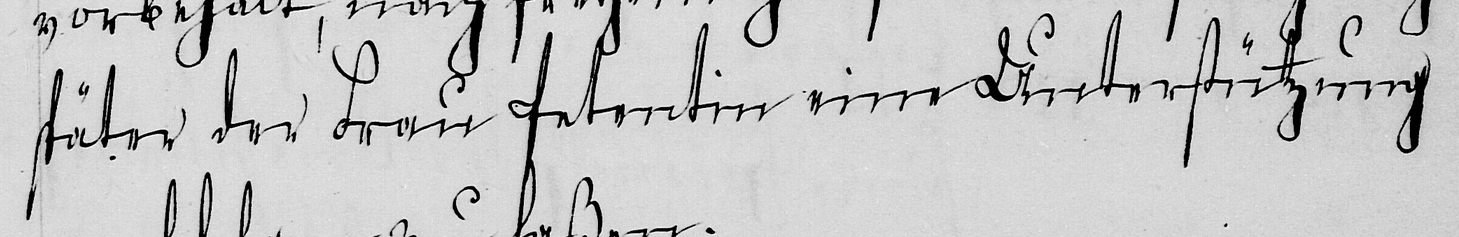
später der Frau Petentin eine Unterstützung
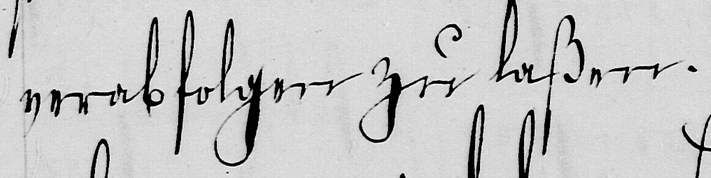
verabfolgen zu laßen.
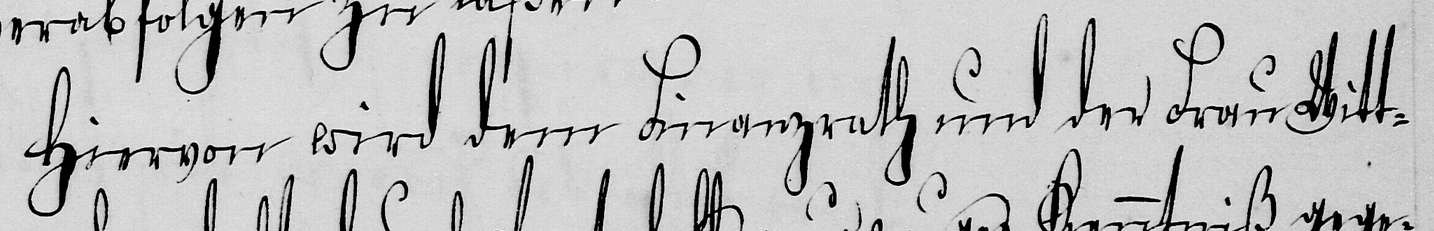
Hiervon wird dem Finanzrath und der Frau Wit¬
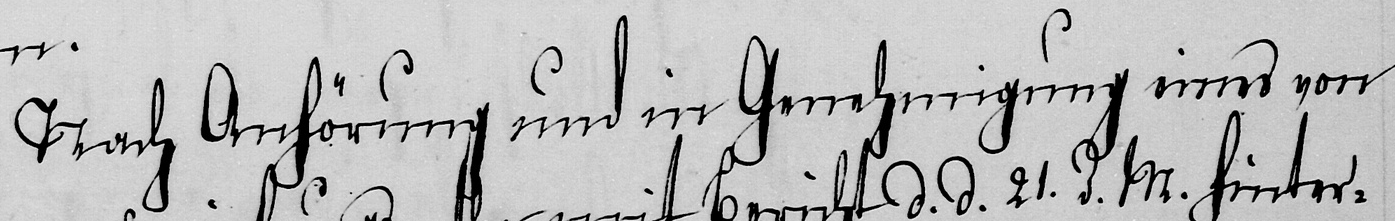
Nach Anhörung und in Genehmigung eines von
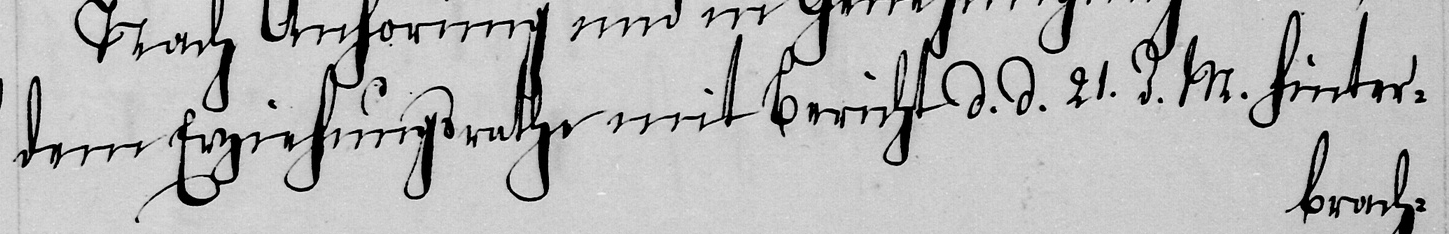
dem Erziehungsrathe mit Bericht d. d. 21. d. M. hinter-
